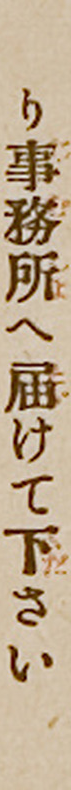り事務所へ届けて下さい
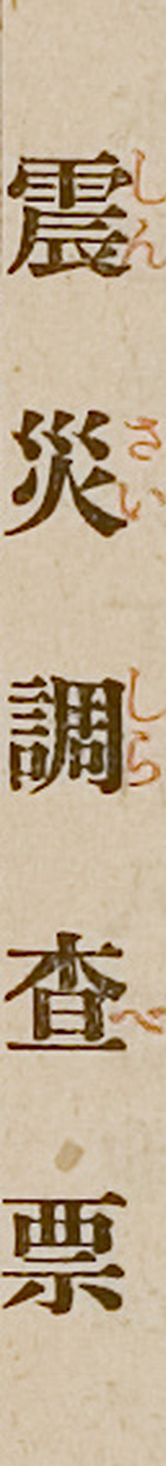震災調査票
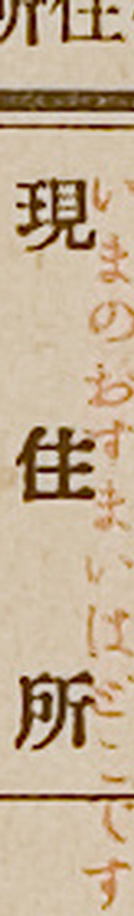現住所
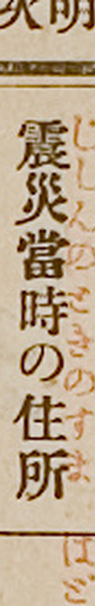震災当時の住所
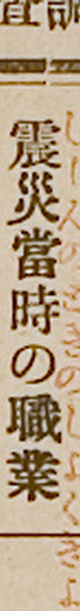震災当時の職業
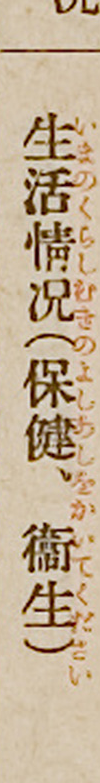生活状況(保健、衛生)
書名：福島県縁故者へ
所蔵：東京大学総合図書館 General Library in the University of Tokyo, JAPAN
